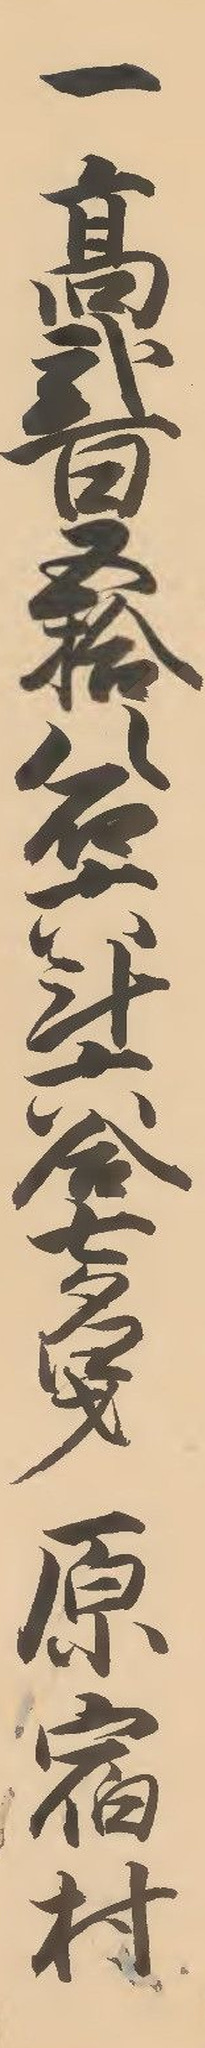一高弐百五拾八石六斗六合七勺四才原宿村
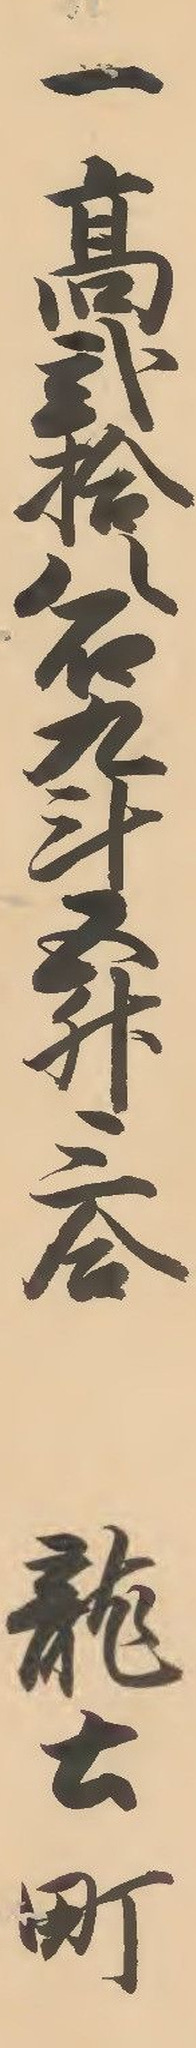一高弐拾八石九斗五升三合龍土町

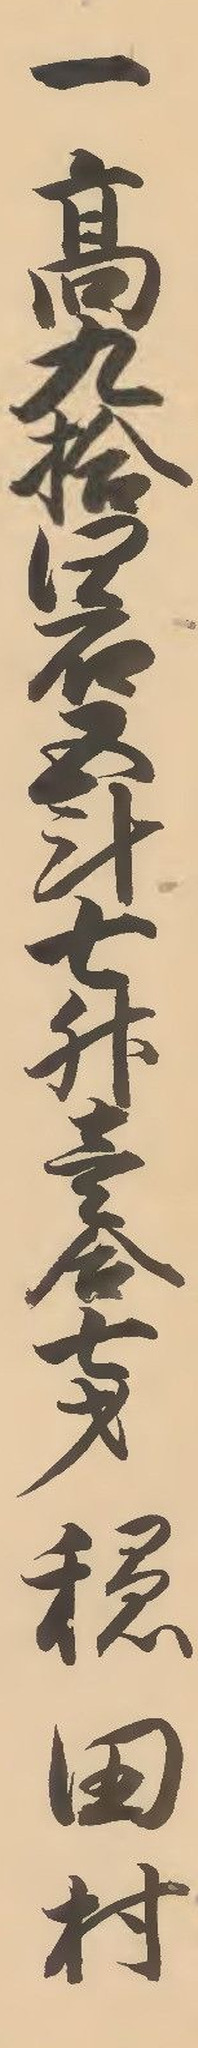一高九拾四石五斗七升壱合七才穏田村
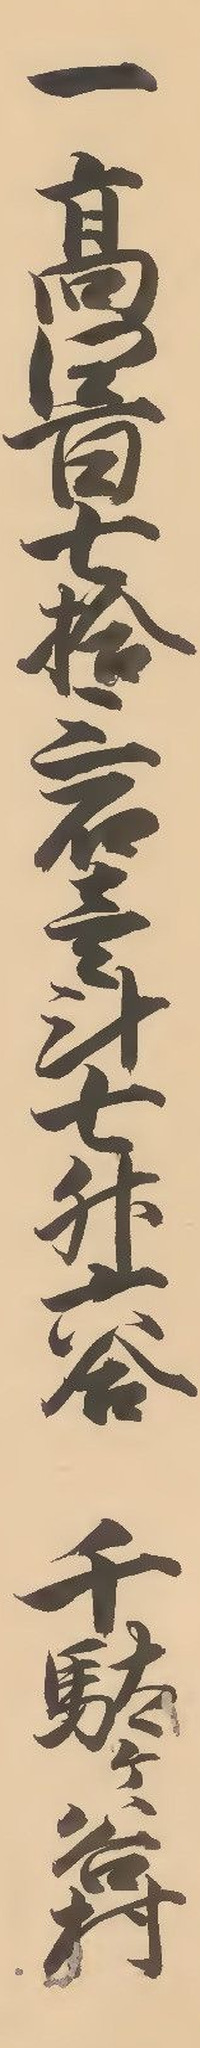一高四百七拾三石壱斗七升六合千駄ヶ谷村
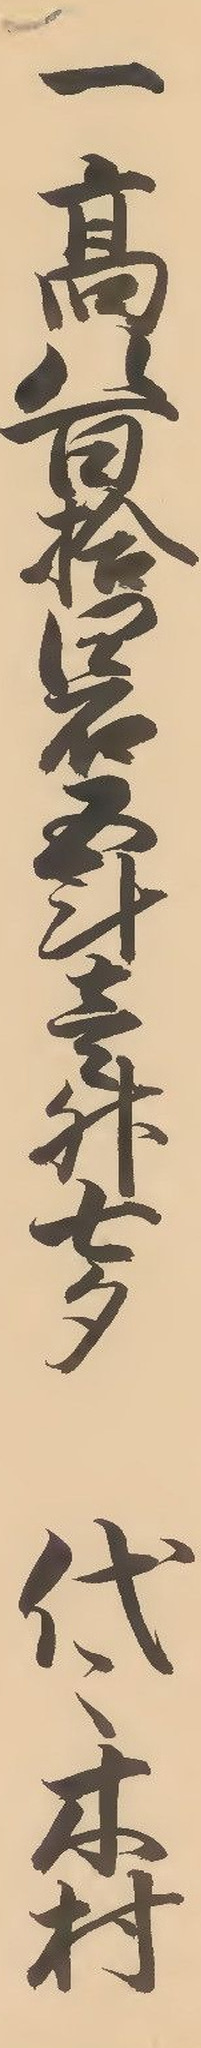一高八百拾四石五斗壱升七勺代々木村
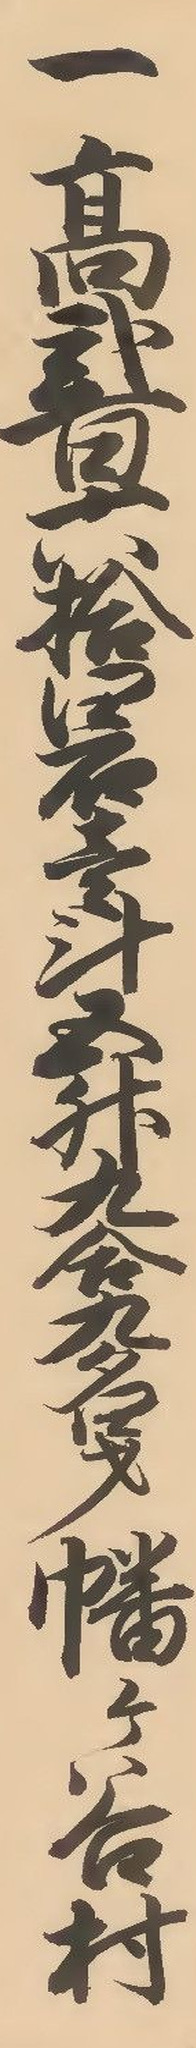一高弐百六拾四石壱斗五升九合九勺四才幡ヶ谷村
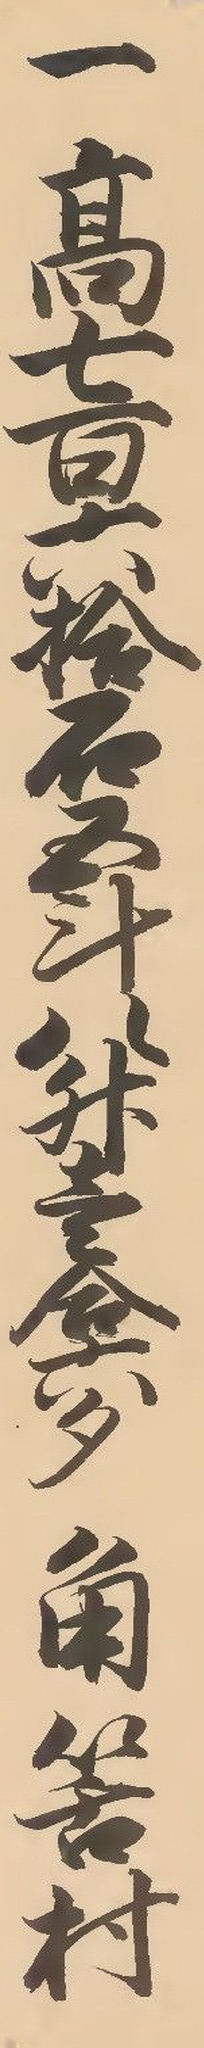一高七百六拾石五斗八升壱合六勺角筈村
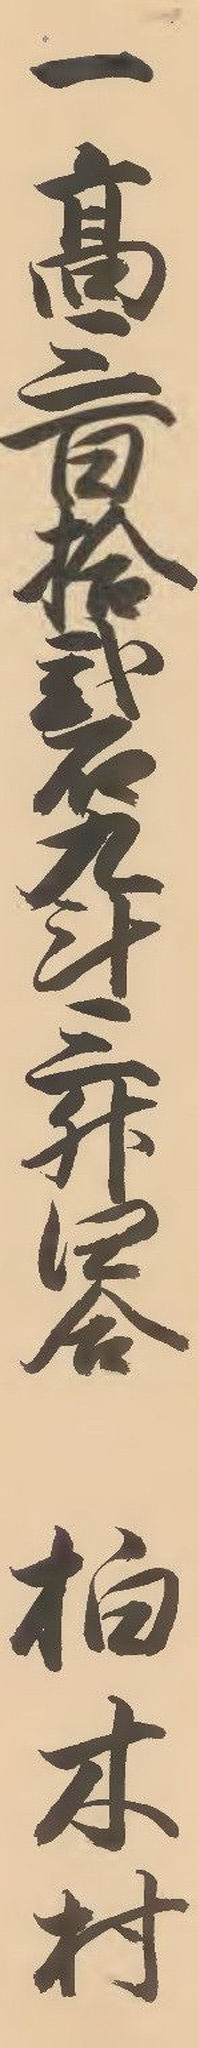一高三百拾弐石九斗三升四合柏木村
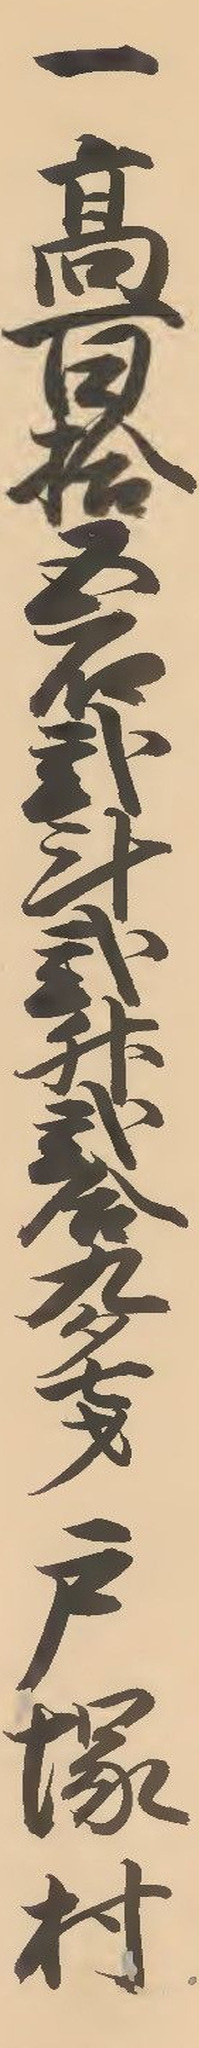一高百拾五石弐斗弐升弐合九勺七才戸塚村
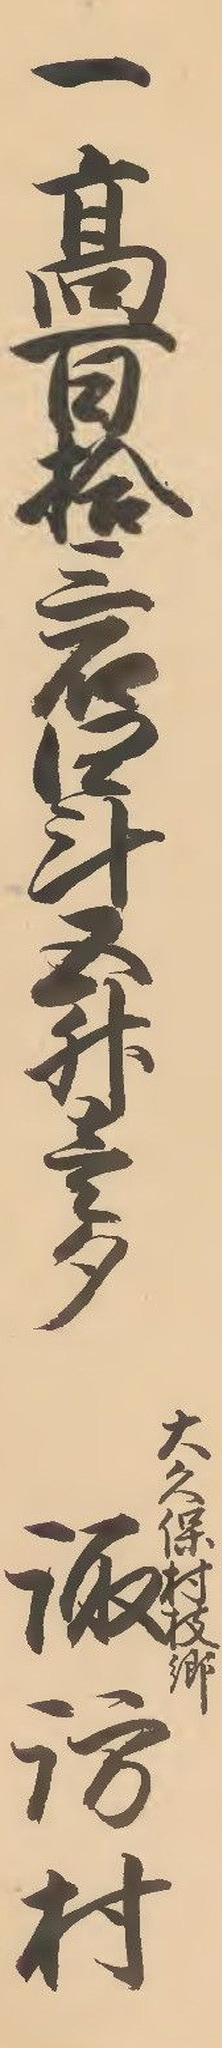一高百拾三石四斗五升壱勺諏訪村

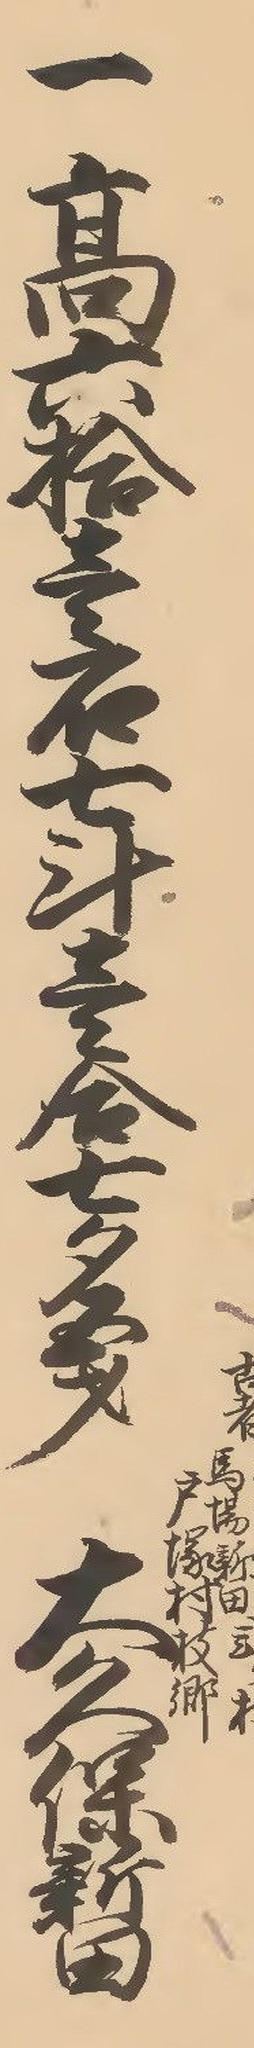一高六拾壱石七斗壱合七勺五才大久保新田
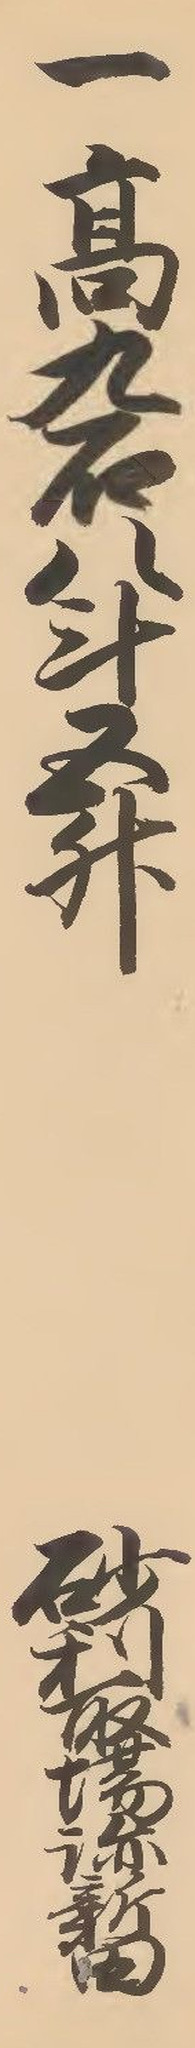一高九石八斗五升砂利取場跡新田
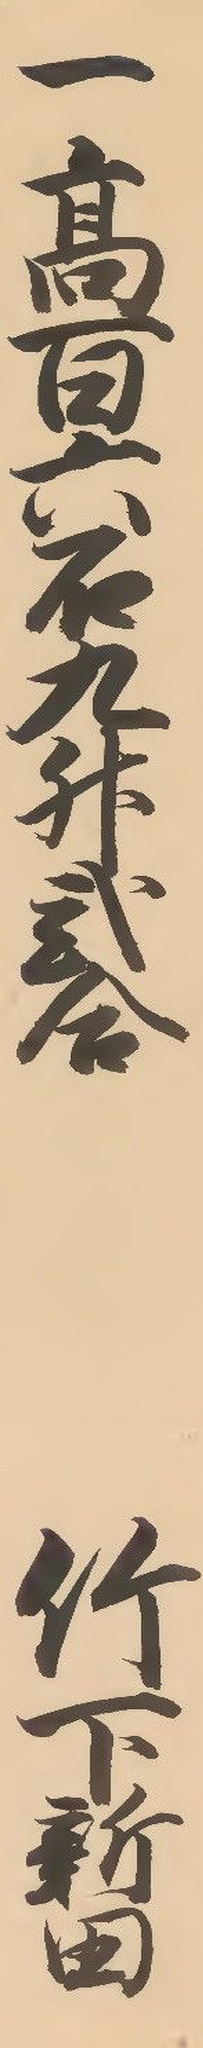一高百六石九升弐合竹下新田
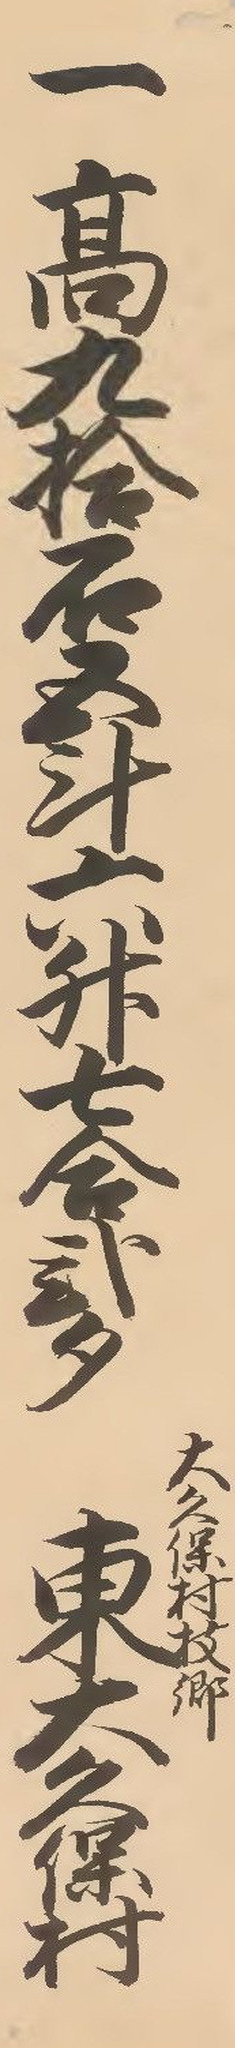一高九拾石五斗六升七合弐勺東大久保村
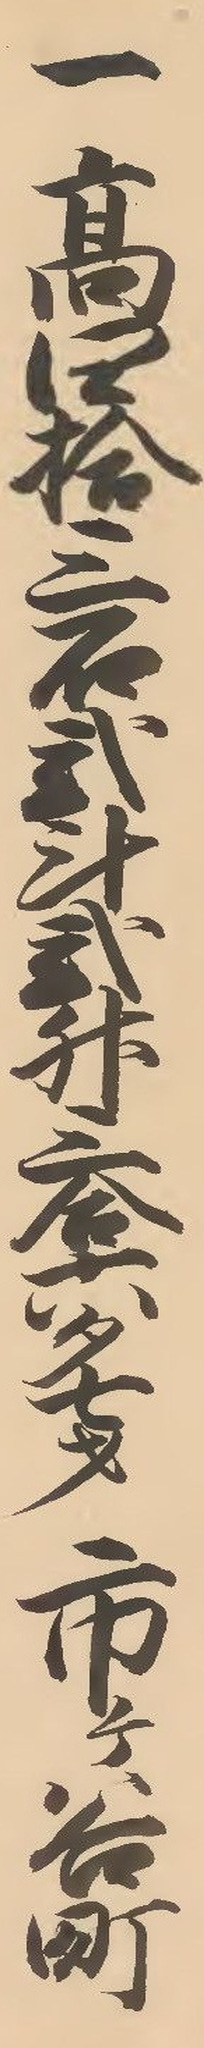一高四拾三石弐斗弐升三合六勺七才市ヶ谷町
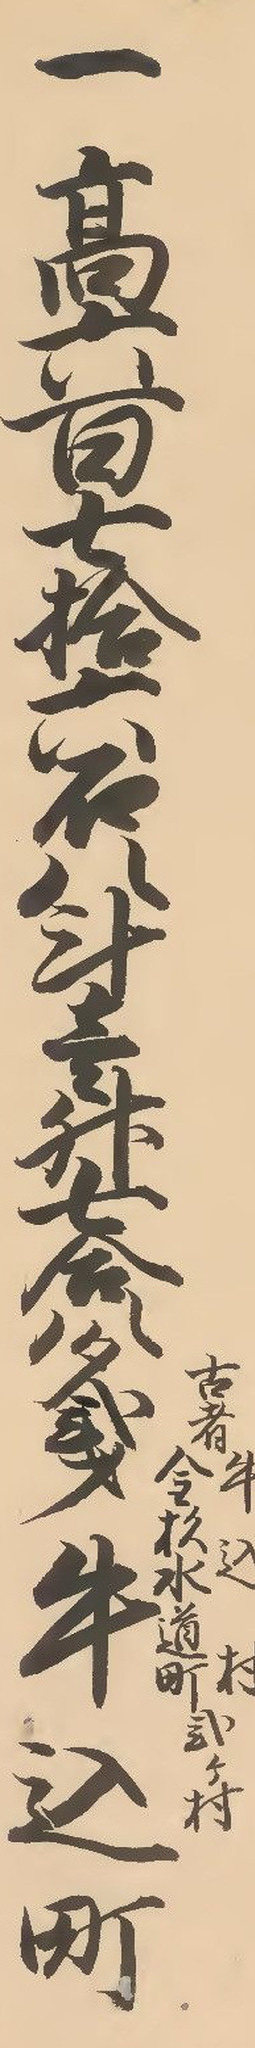一高六百七拾六石八斗壱升七合八勺弐才牛込町
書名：武蔵国郷帳　上
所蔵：国立公文書館 National Archives of Japan
